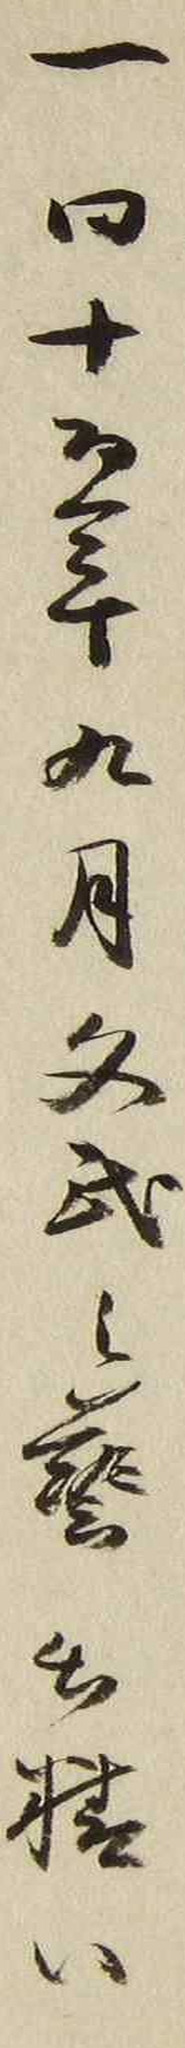一同十酉年九月文武之芸出精い
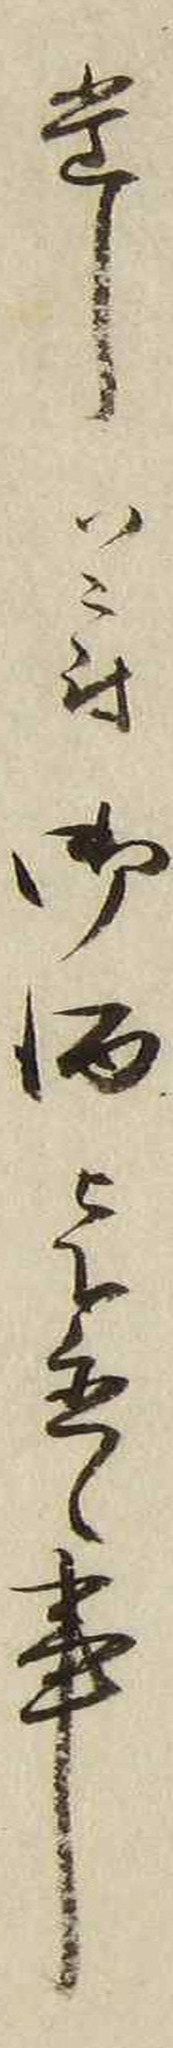たし候ニ付御酒被下置候事

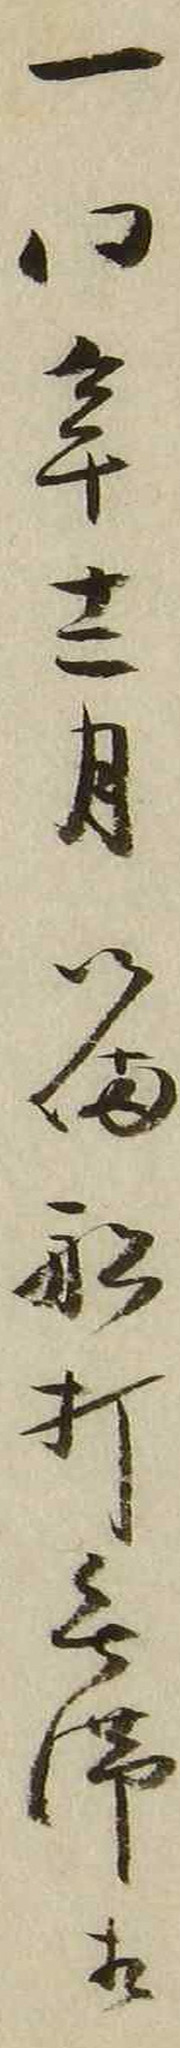一同年十二月御備船打無滞相
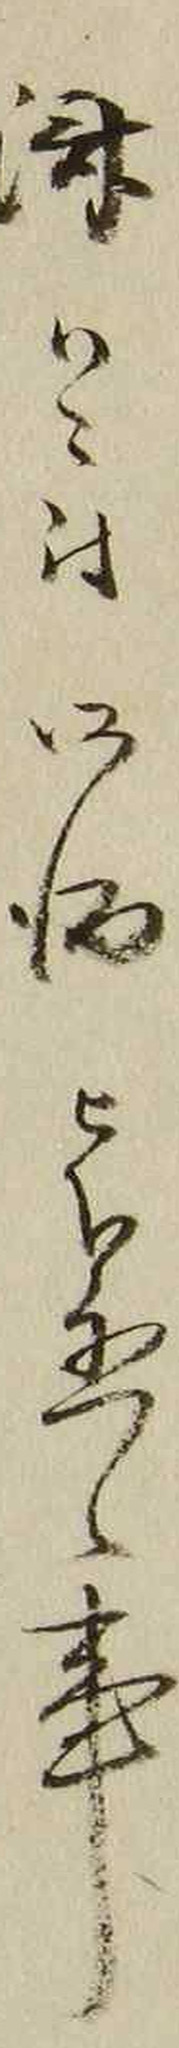済候ニ付御酒被下置候事
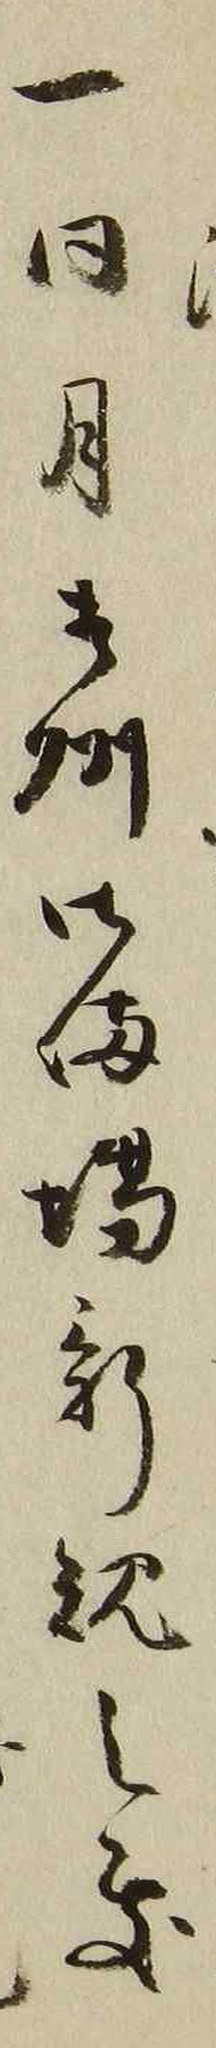一同月相州御備場新規之処
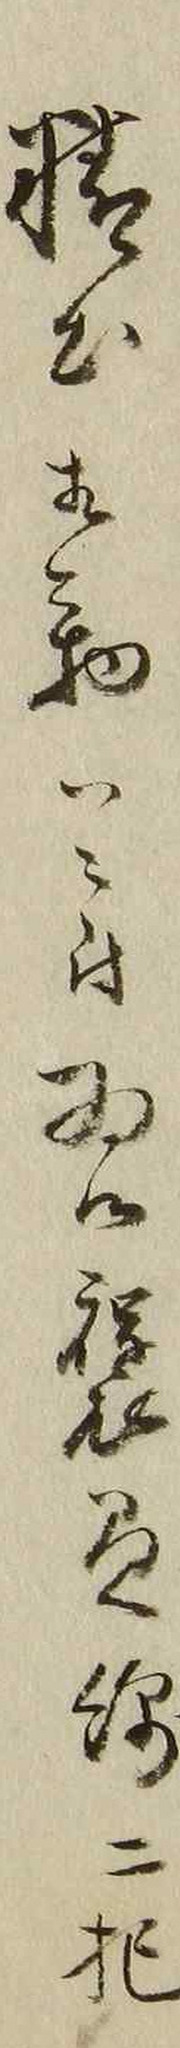精出相勤候ニ付為御褒美綿二把
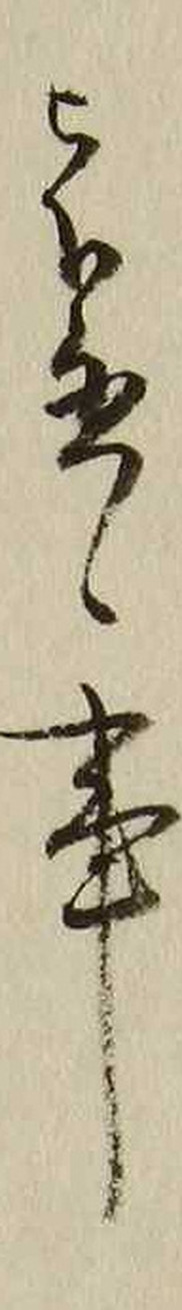被下置候事
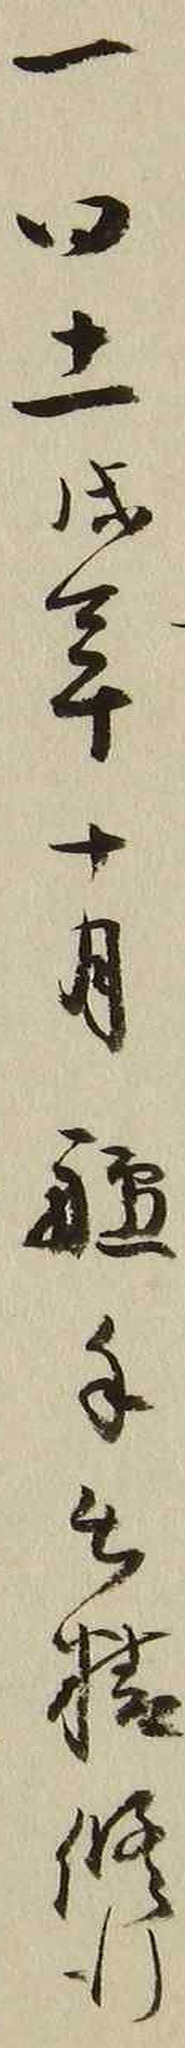一同十一戌年十月艫手出精修行
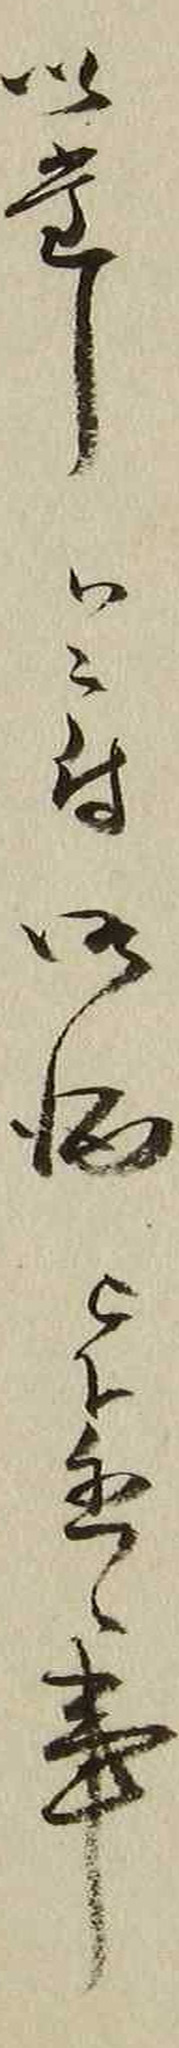いたし候ニ付御酒被下置候事
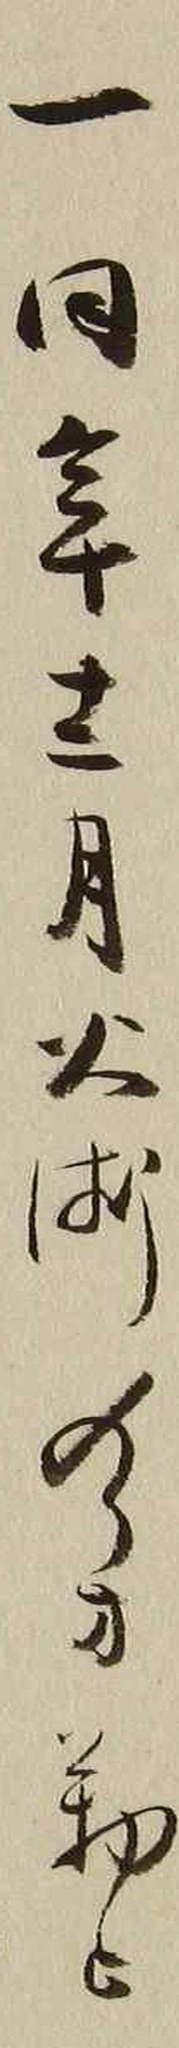一同年十二月火術〆り方勤被
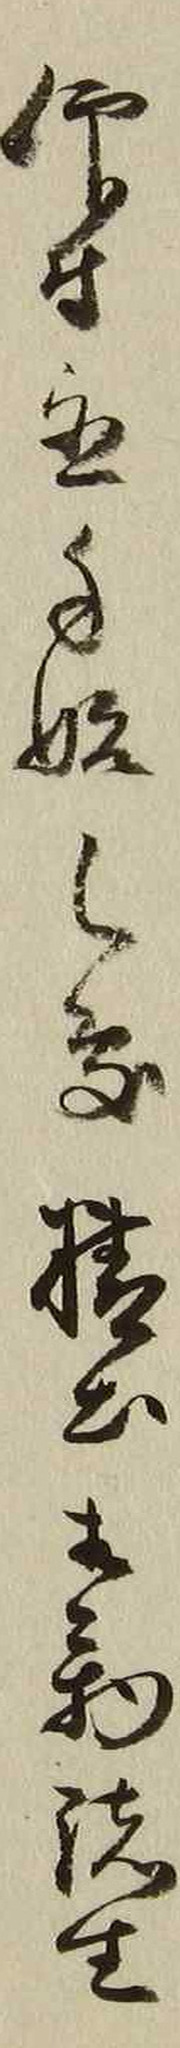仰付置手始之処精出相勤諸生
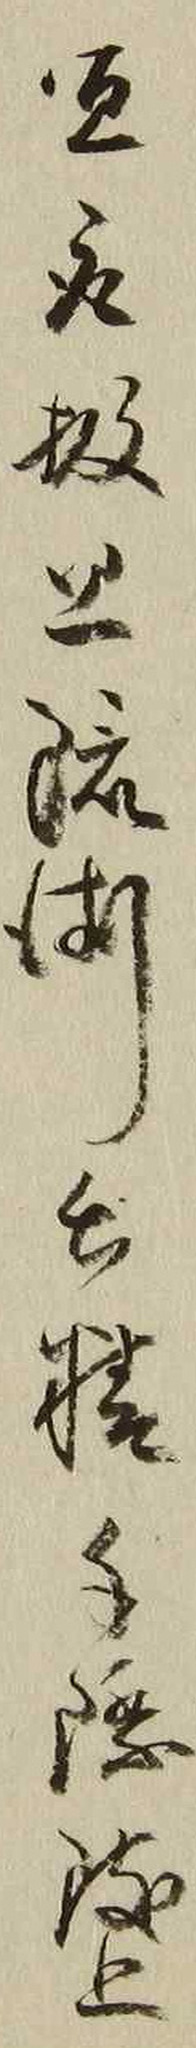宜取扱且銃術出精手際致上
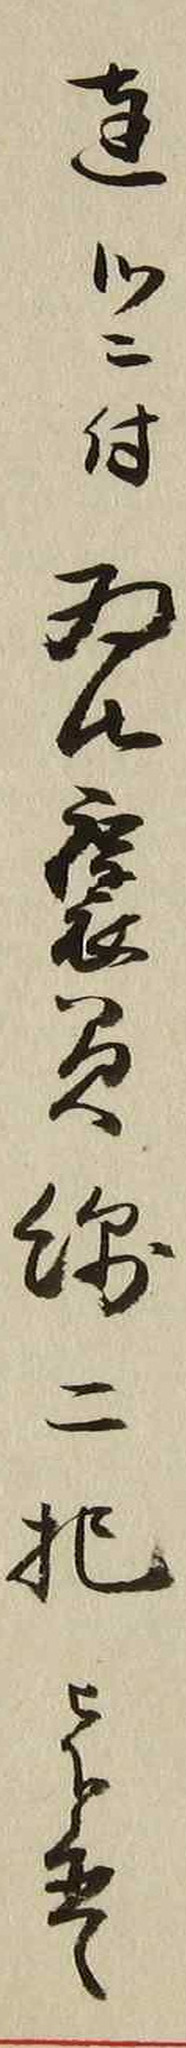達候ニ付為御褒美綿二把被下置候
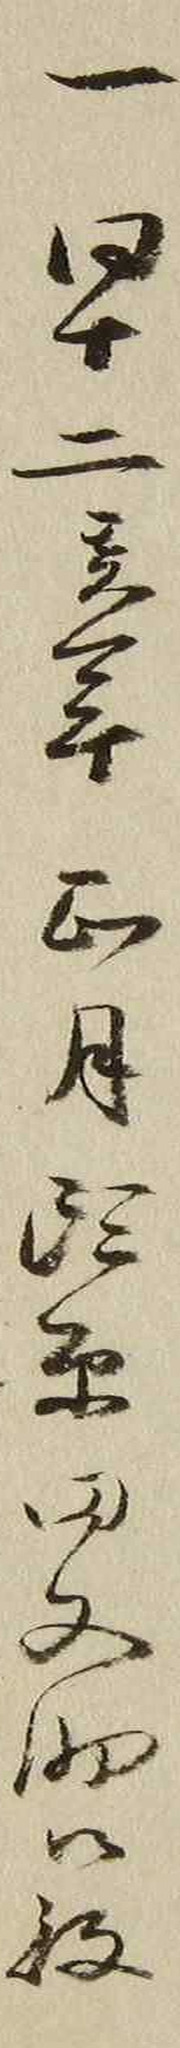一同十二亥年正月頭原田又助御役
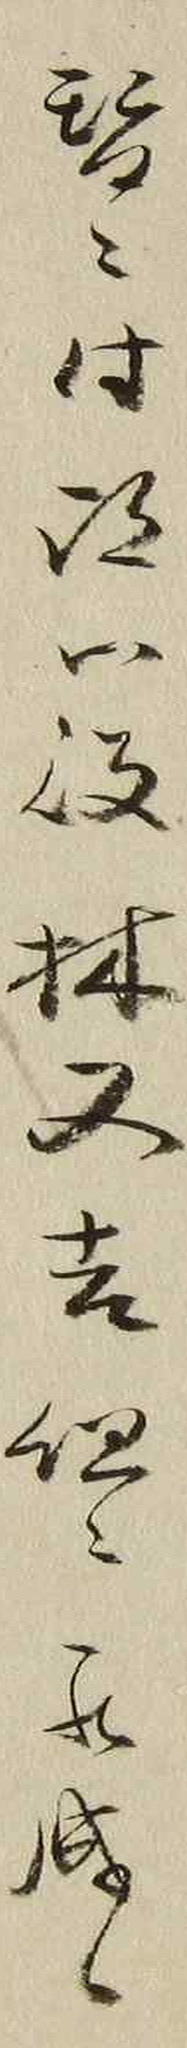替ニ付跡御役林又吉組ニ罷成候
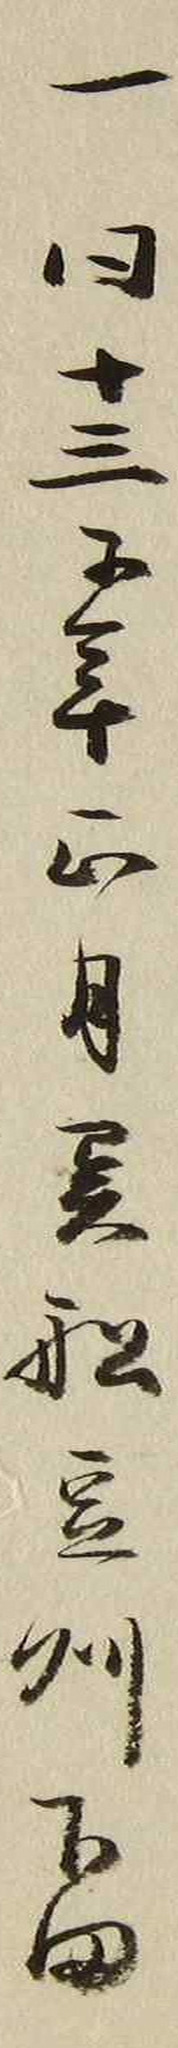一同十三子年正月異船豆州下田
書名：諸士系譜　巻之288　さ之部20
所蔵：会津若松市立会津図書館
